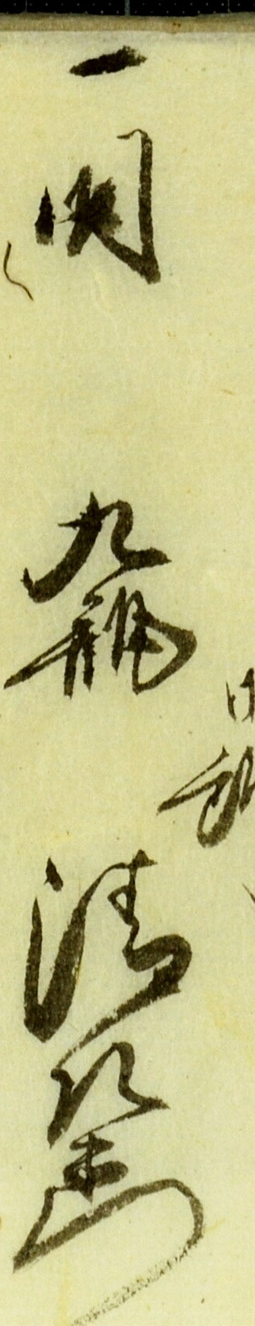一同九瓶清左衛門
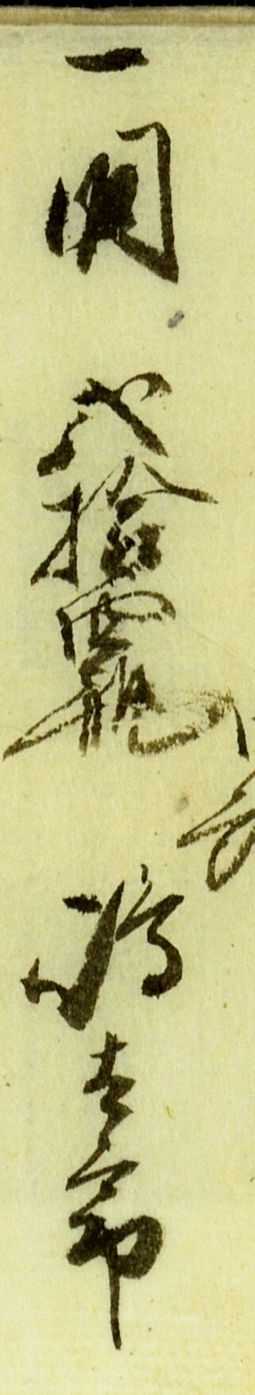一同弐拾四瓶島太郎
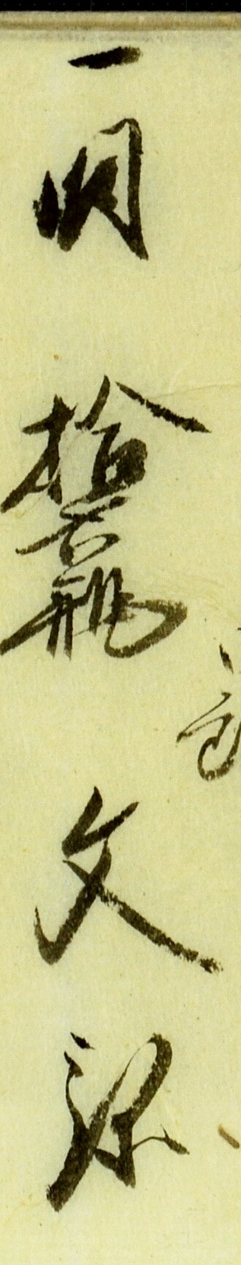一同拾六瓶文弥
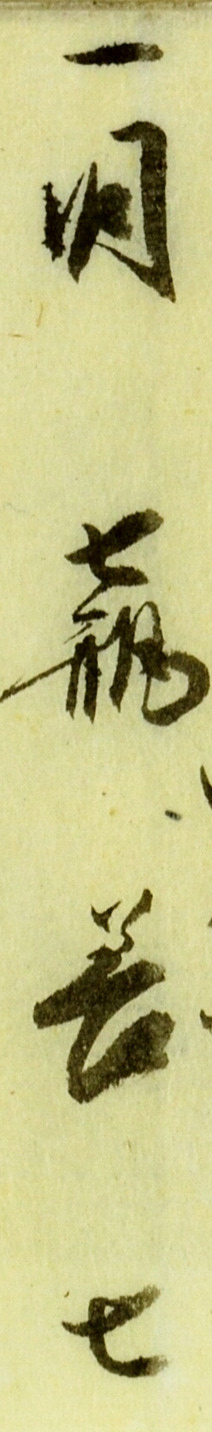一同七瓶善七
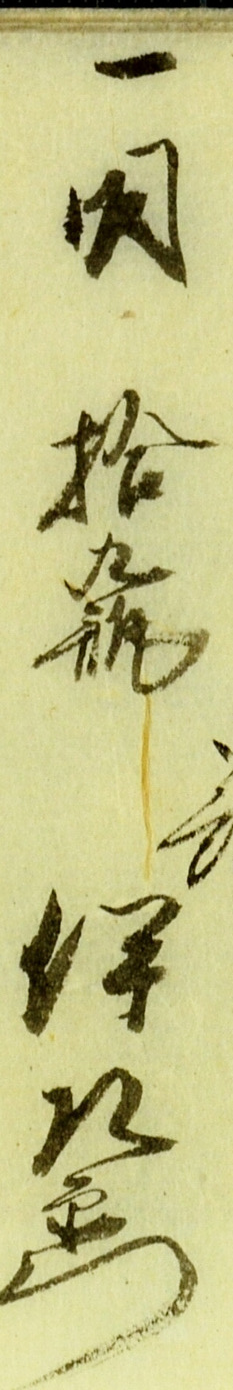一同拾九瓶伊左衛門
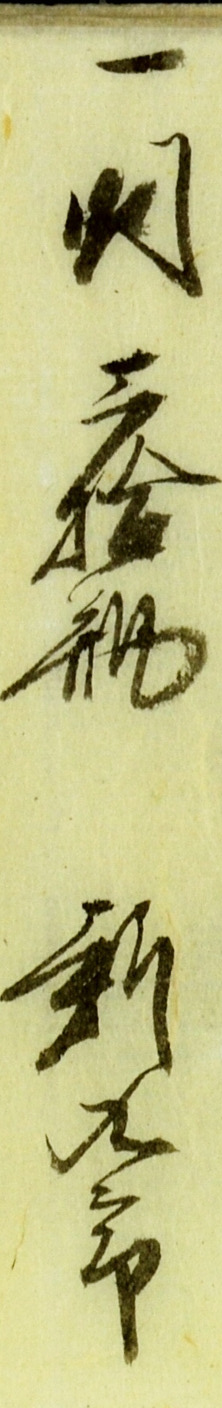一同三拾瓶新九郎
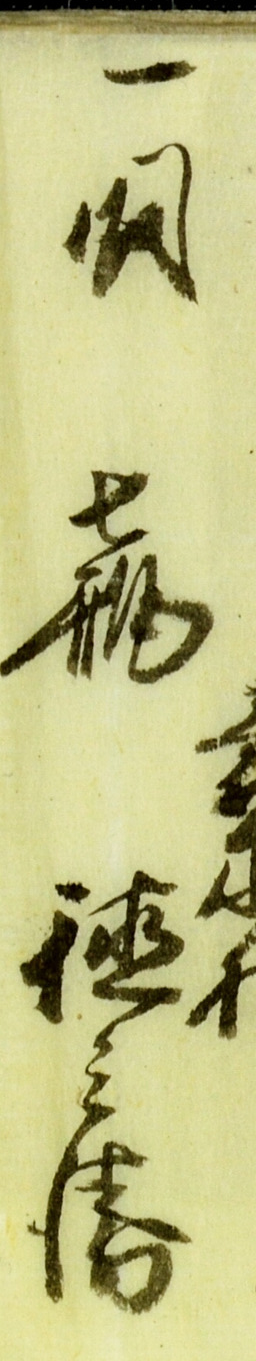一同七瓶徳兵衛

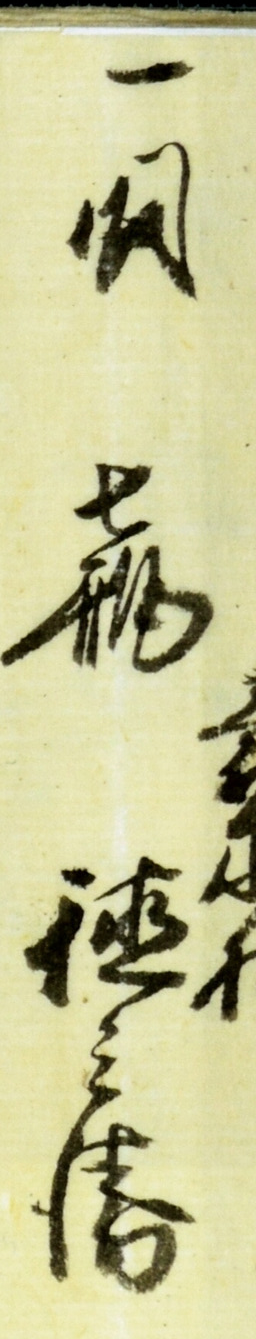一同三拾瓶庄兵衛
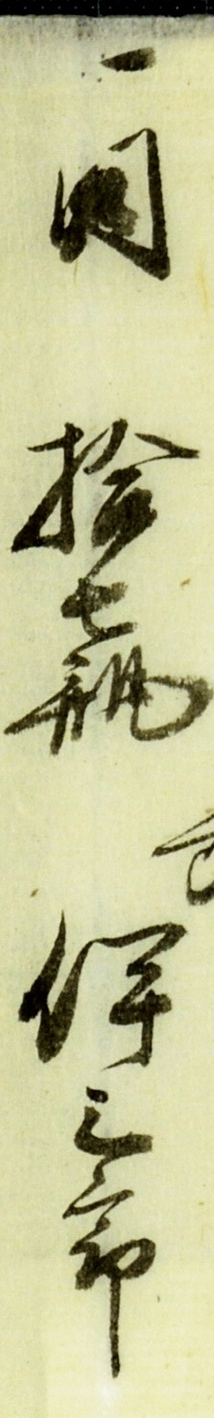一同拾七瓶伊三郎
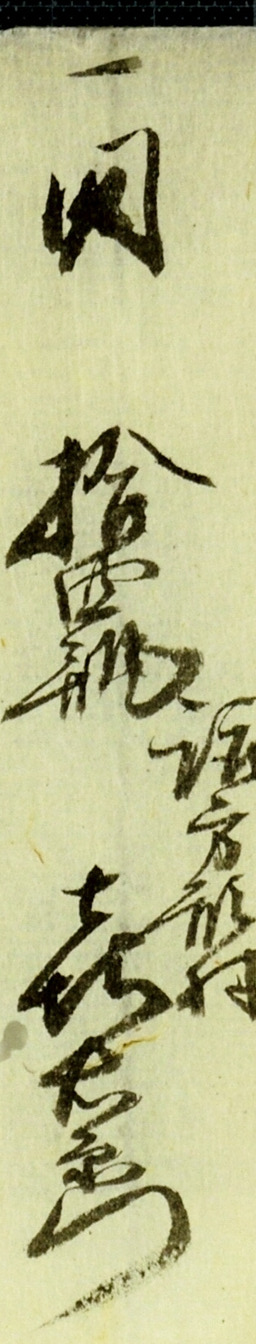一同拾四瓶喜右衛門
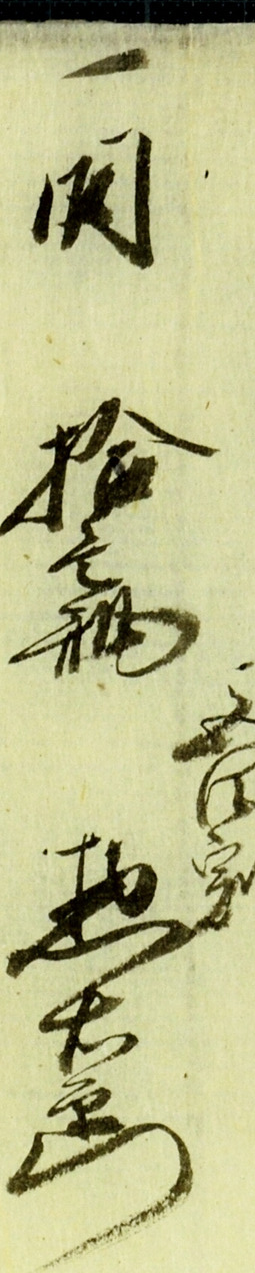一同拾壱瓶惣右衛門
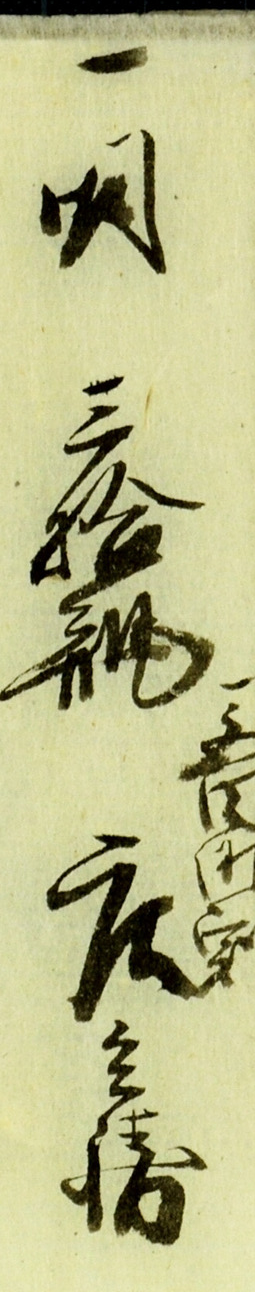一同三拾瓶庄兵衛
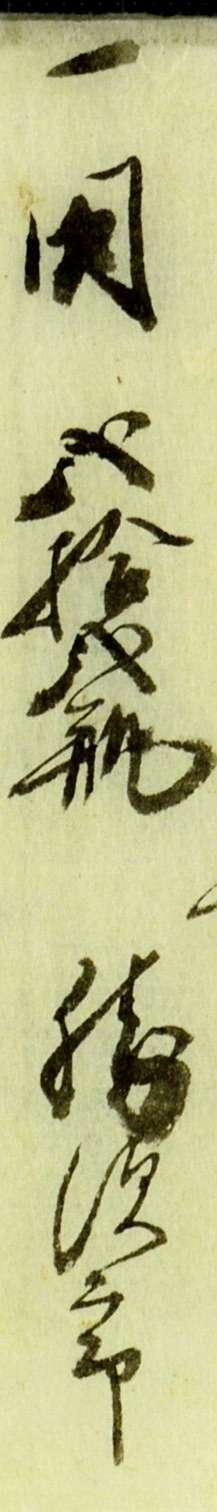一同弐拾弐瓶勝治郎
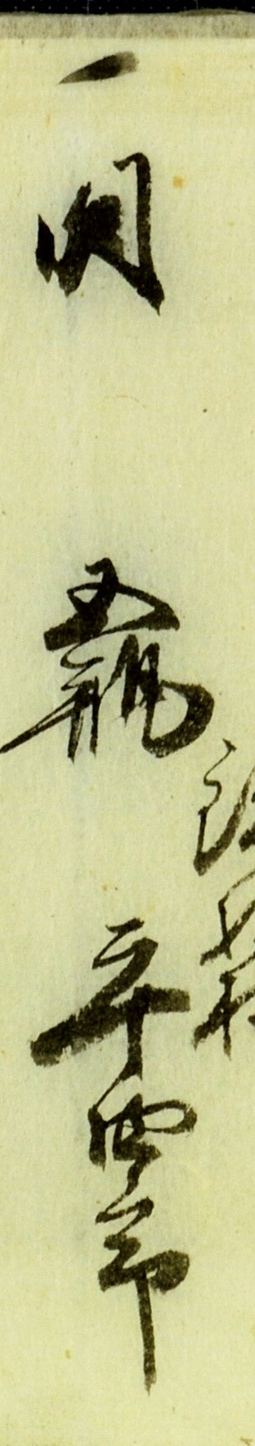一同五瓶平四郎
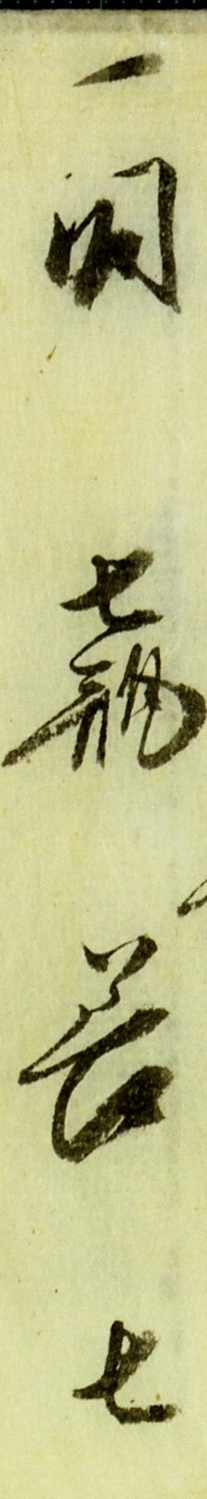一同七瓶善七

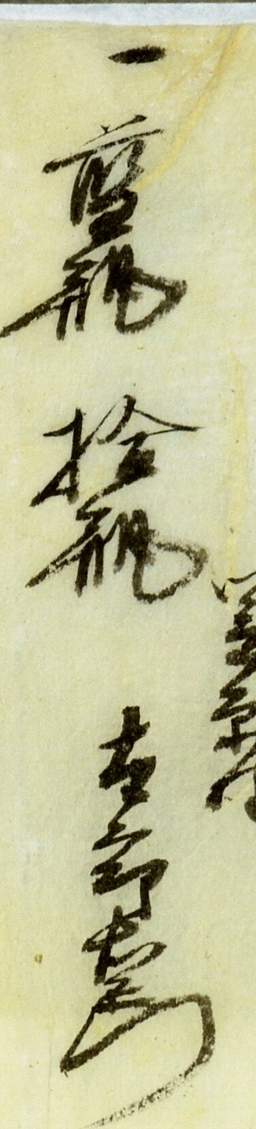一藍瓶拾瓶太郎右衛門
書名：御領分中御領分中紺屋藍瓶員数御改帳
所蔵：伊那市立高遠町図書館・合同会社AMANE
